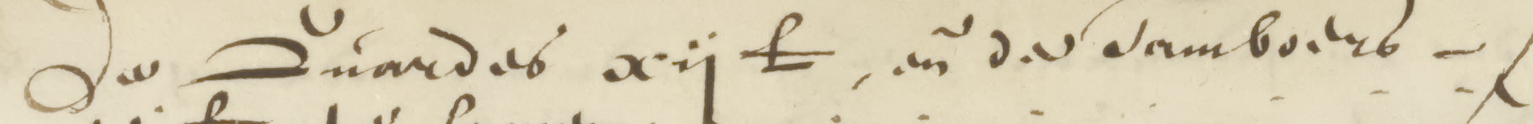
De Guardes xij L, en de Tamboers -
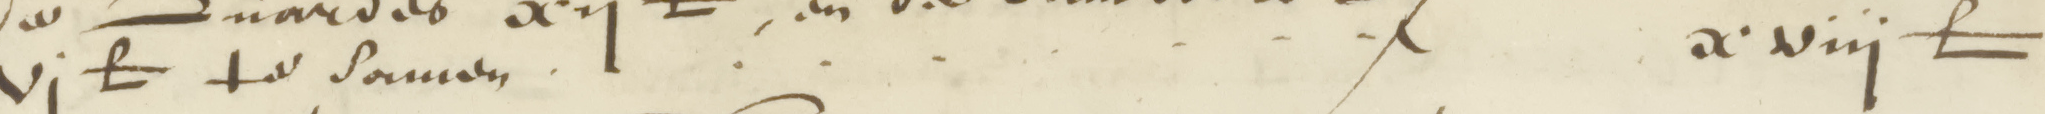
vj L te samen . . . . . . . . ⁁ xviij L
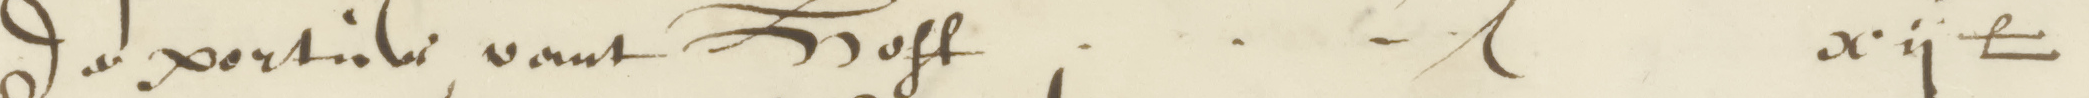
De portier vant Hoff . . . . ⁁ xij L
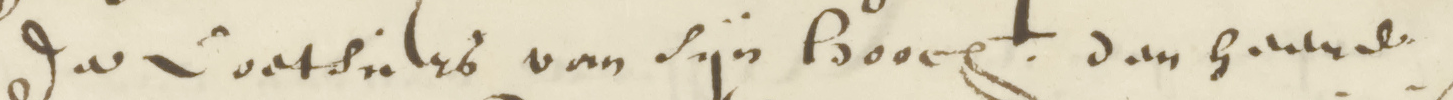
De Coetsiers van sijn hoocht. den heere
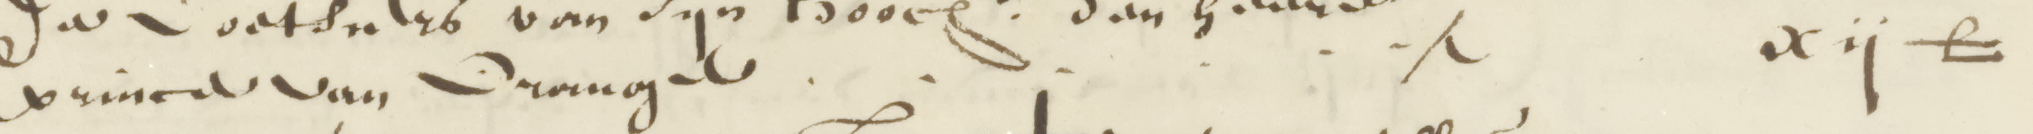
prince van Orange . . . . . . ⁁ xij L
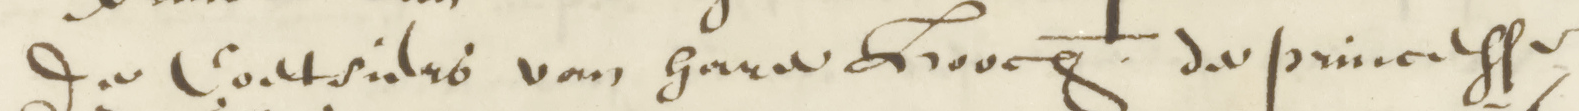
De Coetsiers van hare Hoocht. de princesse
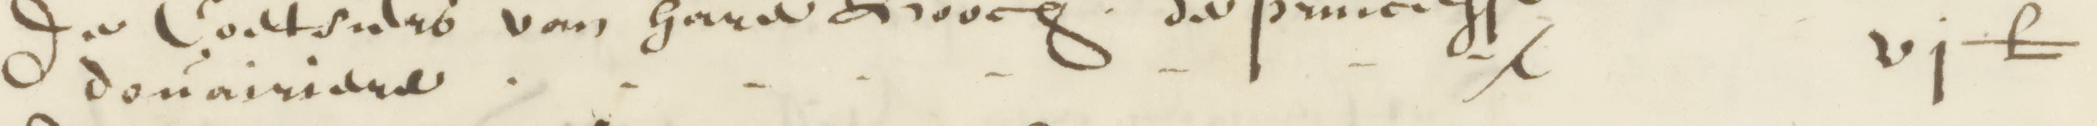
douairiere . . . . . . . . ⁁ vj L
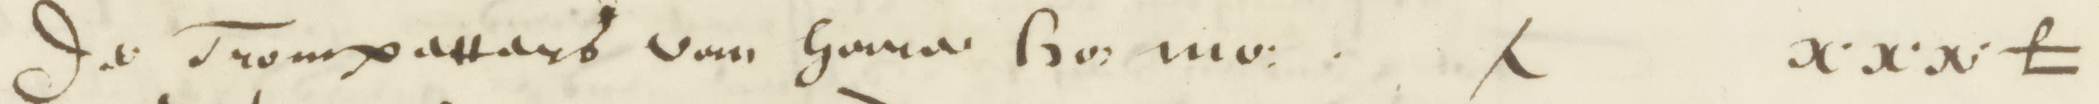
de Trompetters van hare ho:mo: . ⁁ xxx L
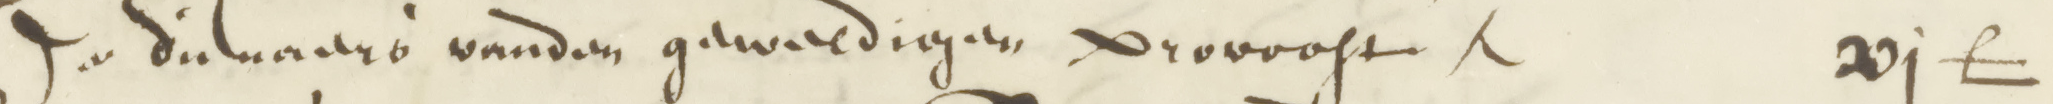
De dienaers vanden geweldigen provoost ⁁ vj L
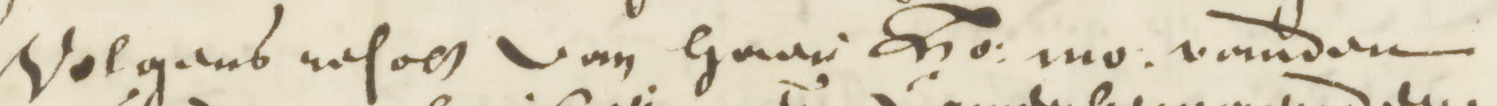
Volgens resol van haer Ho:Mo: vanden
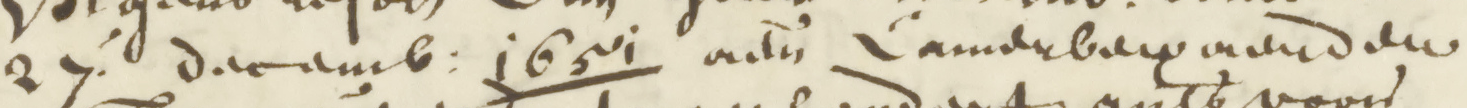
27e. decemb: 1651 aen Camerbewaerder
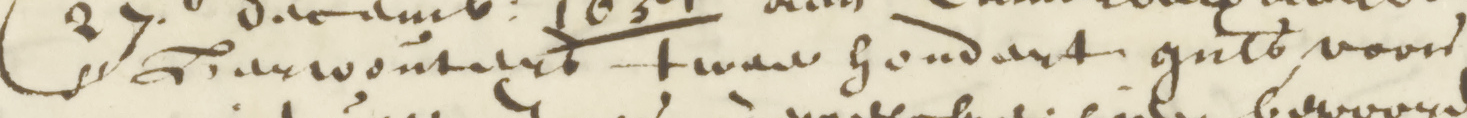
s'Herwouters twee hondert guls voor
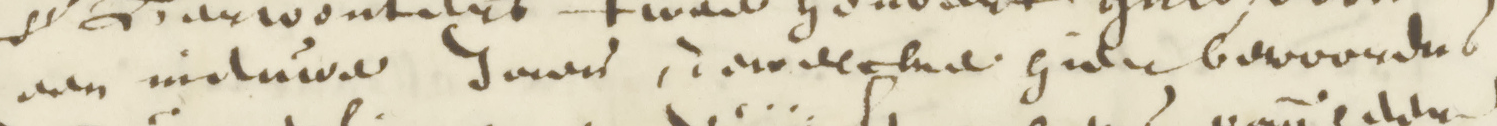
een nieuwe Jaer, dewelcke hier bevoorens
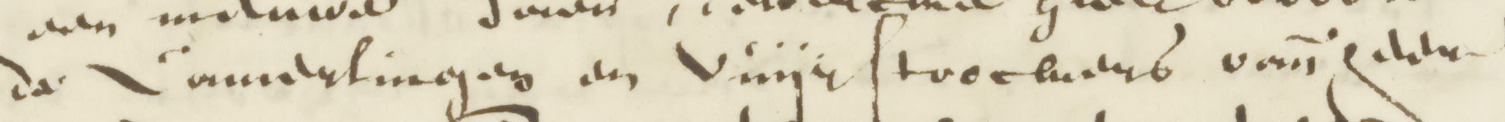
de Camerlingen en vuijrstoockers van heer
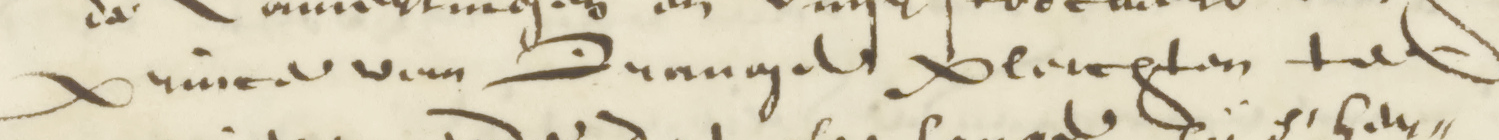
Prince van Orange plachten te
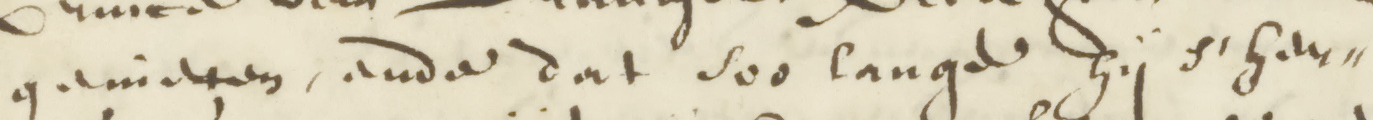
genieten, ende dat soo lange hij s'her„
